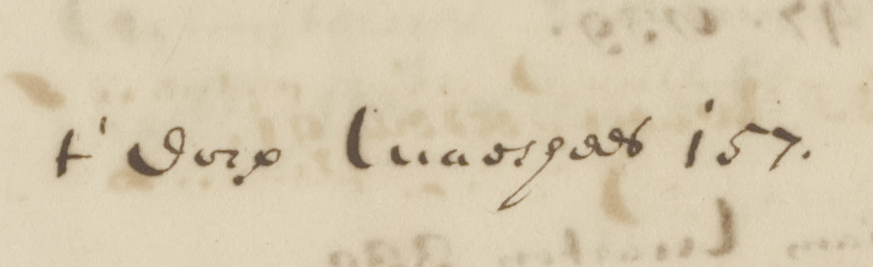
t' Dorp Maeshees 157.
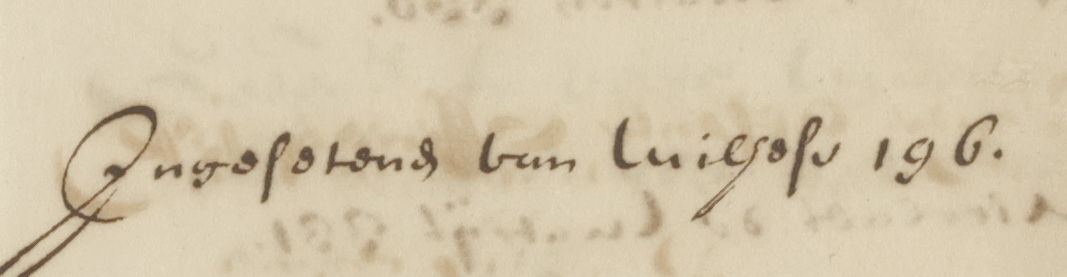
Ingesetenen van Milhese 196.
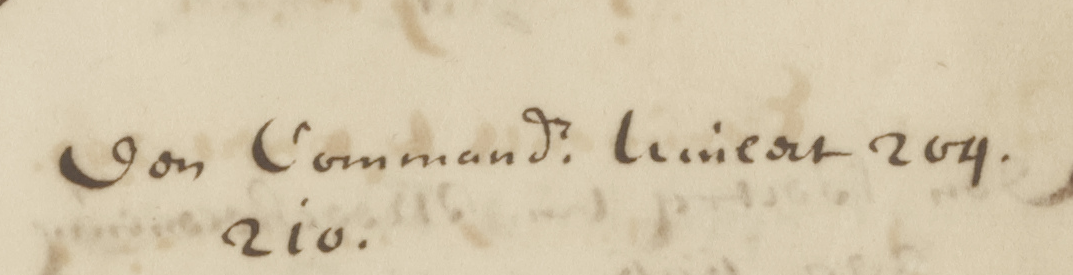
Den Commandr. Mulert 204.
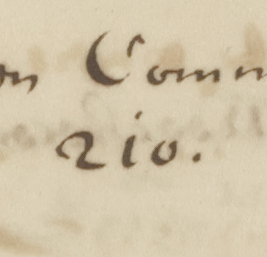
210.
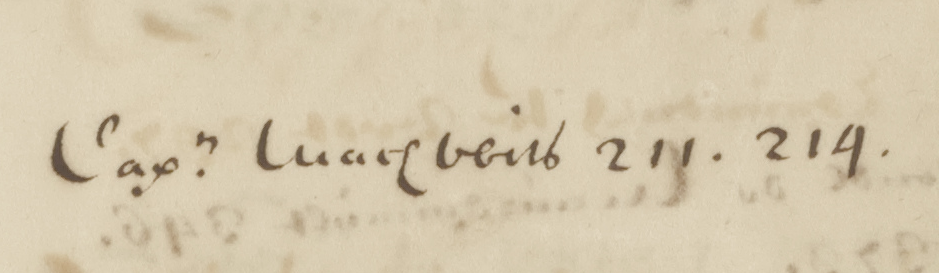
Capn. Machwits 211. 214.
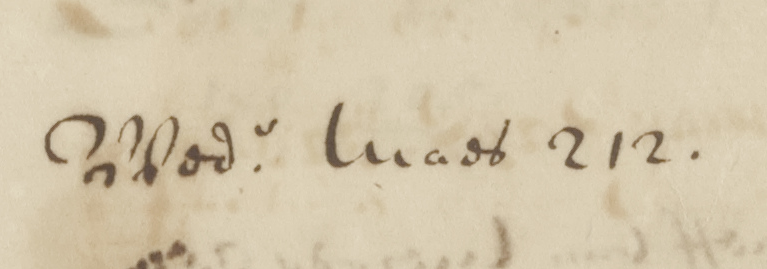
Wede. Maes 212.
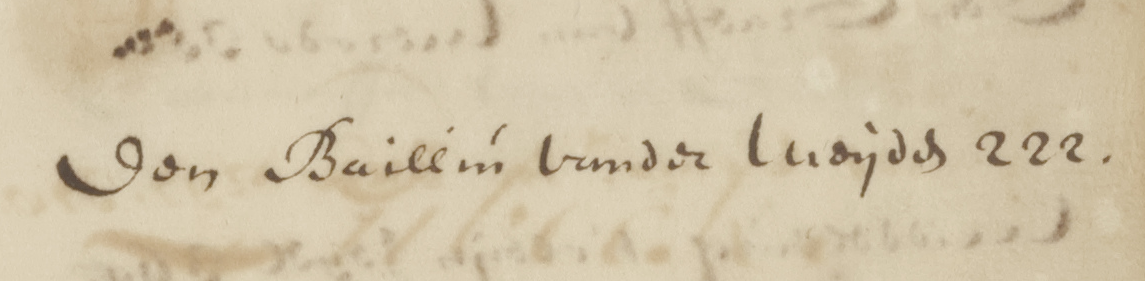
Den Bailliu vander Meijden 222.
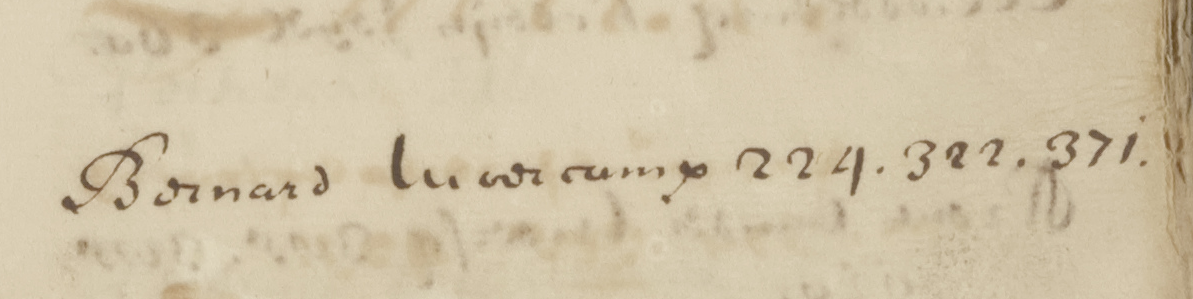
Bernard Moercamp 224. 322. 371.
